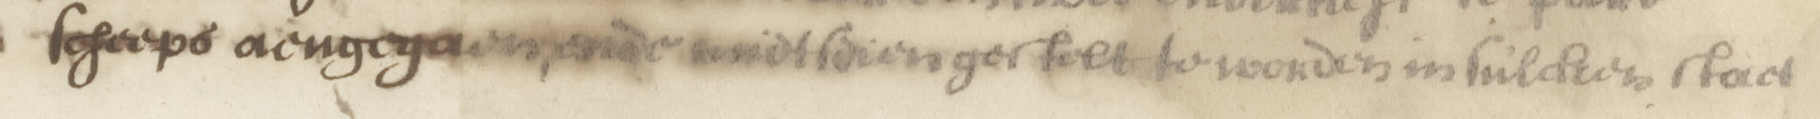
scheeps aengegaen, ende midtsdien gestelt te worden in sulcken staet
